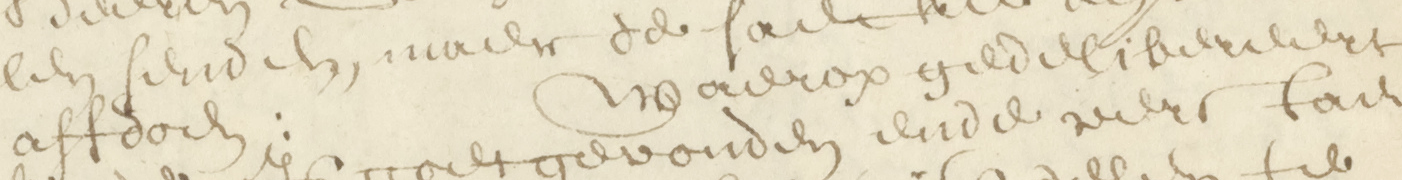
affdoen: Waerop gedelibereert
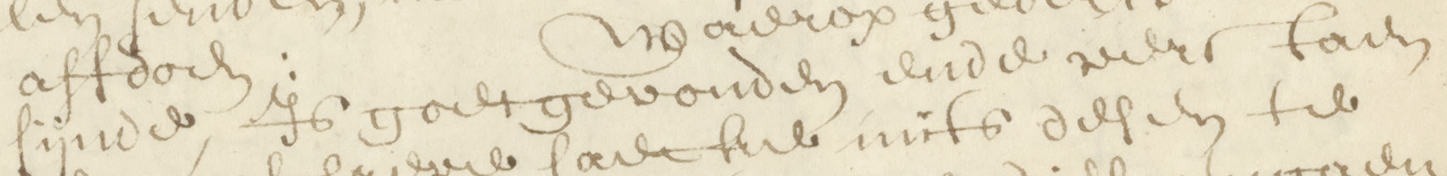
sijnde, Is goetgevonden ende verstaen
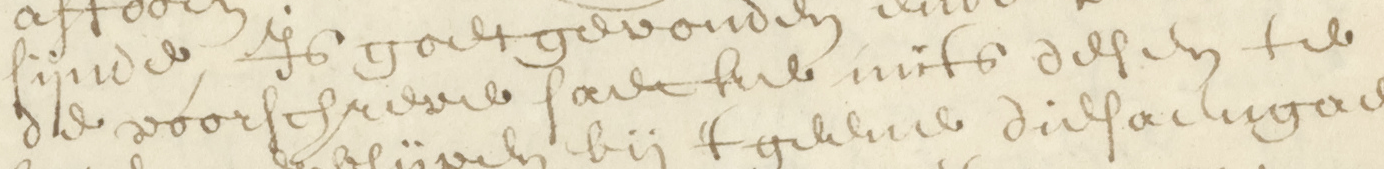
de voorschreve saecke mits desen te
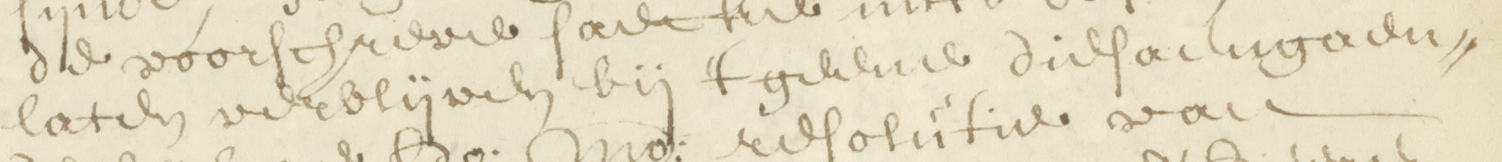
laten verblijven bij 't geene diesaengaen,,
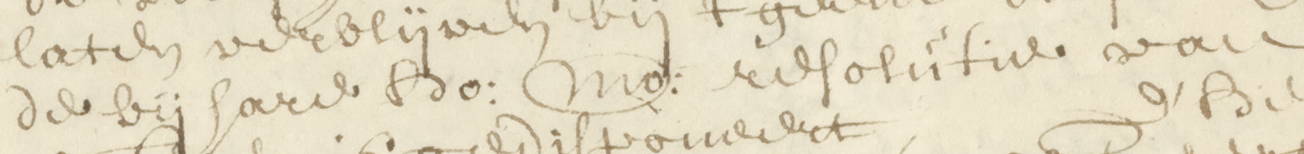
de bij hare Ho:Mo: resolutie van
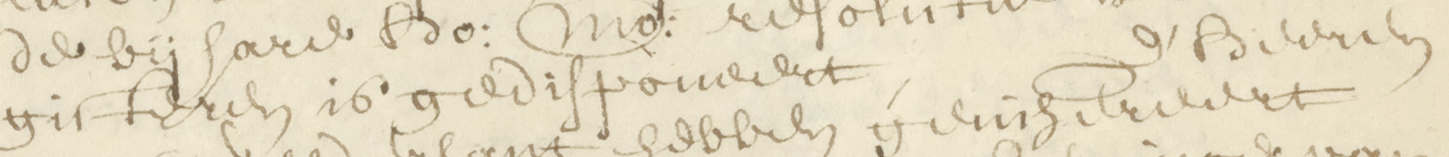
gisteren is gedisponeert. D'heeren
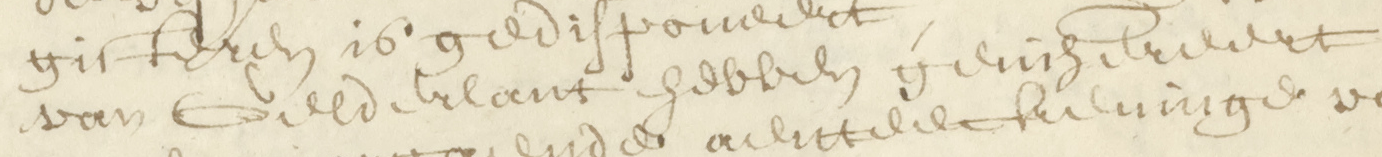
van Gelderlant hebben geinhereert
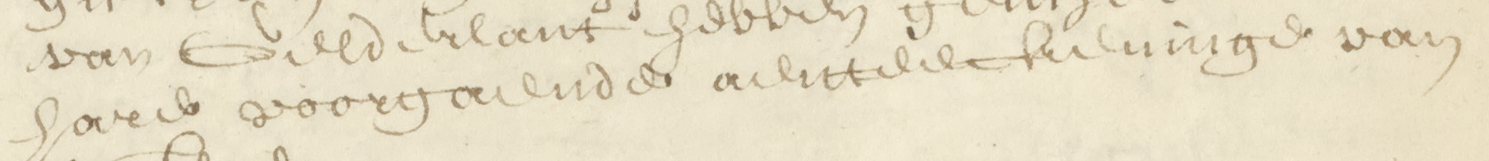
hare voorgaende aenteeckeninge van
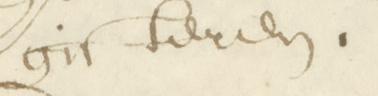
gisteren.
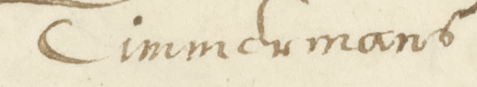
Timmermans
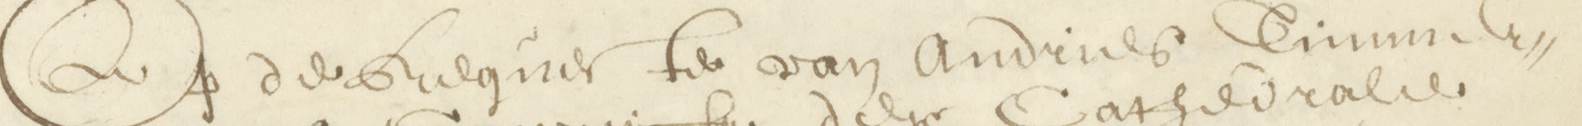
Op de Requeste van Andries Timmer,,
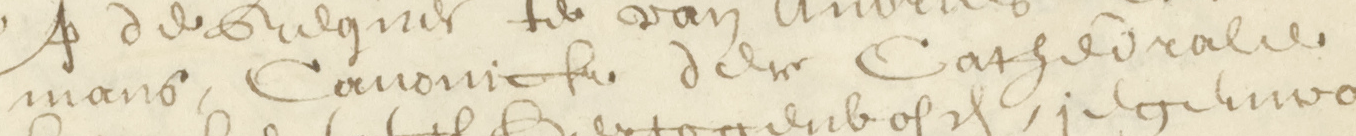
mans, Canonick der Cathedrale
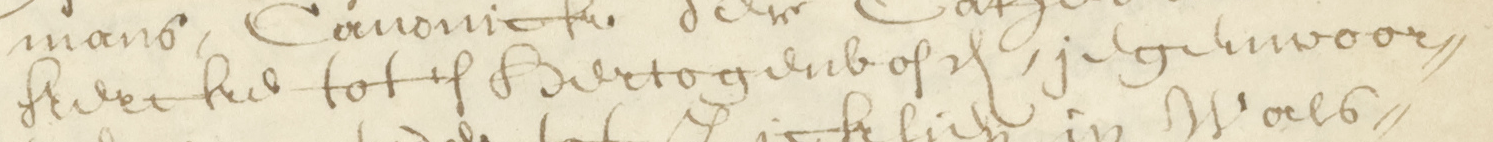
kercke tot ‛s Hertogenbosch, jegenwoor„
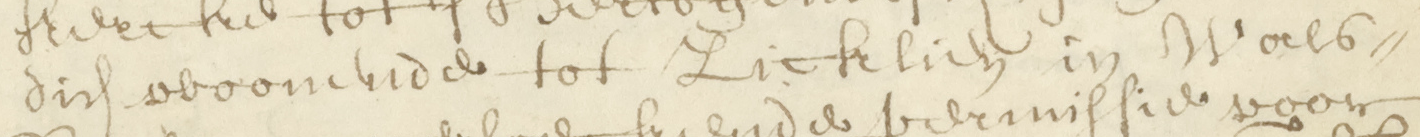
dich woonende tot Zicklier in Wals„
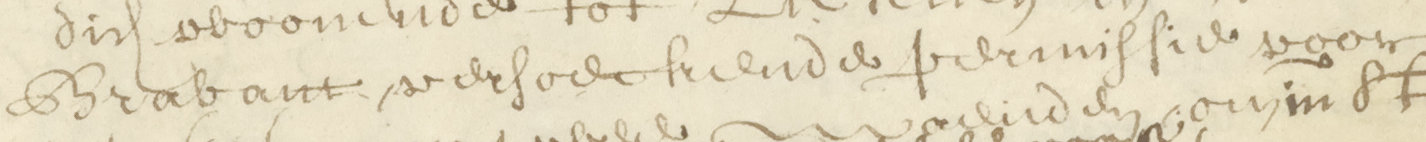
Brabant, versoeckende permissie voor
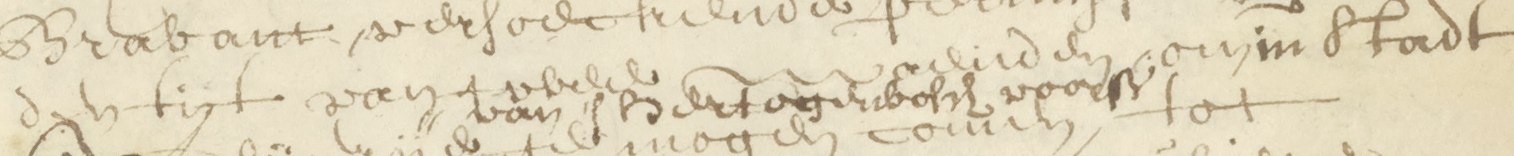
den tijt van twee maenden, om inden Stadt
